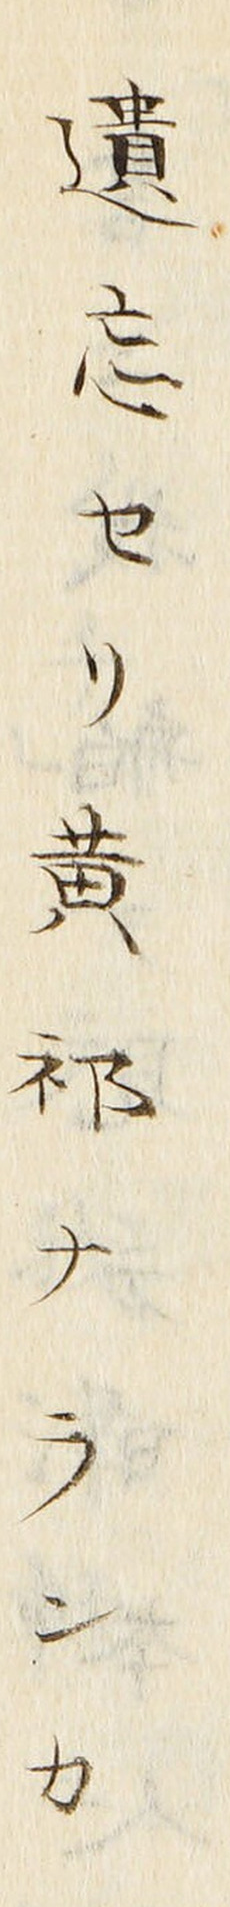遺忘セリ黄祁ナランカ
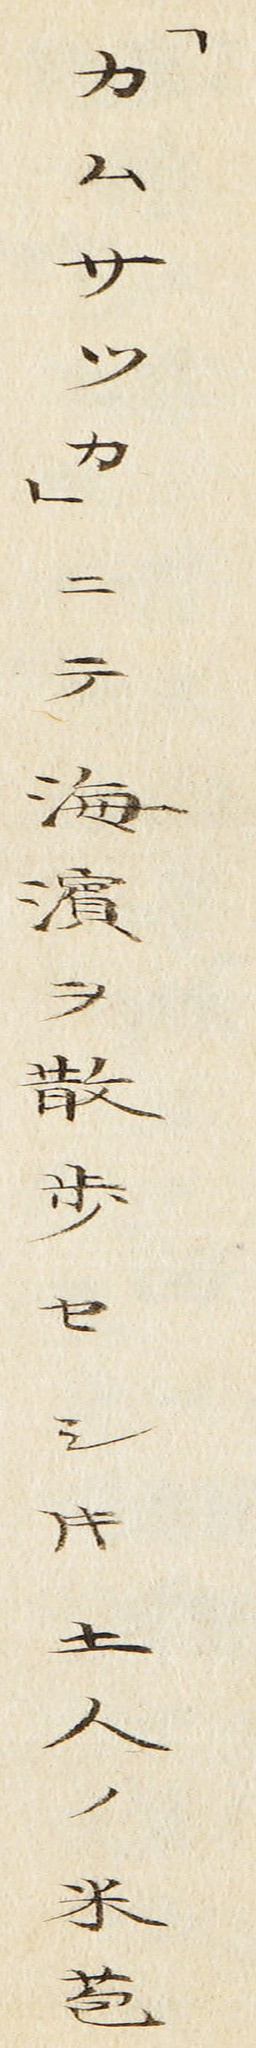〇「カムサツカ」ニテ海濵ヲ散歩セシトキ土人ノ米苞
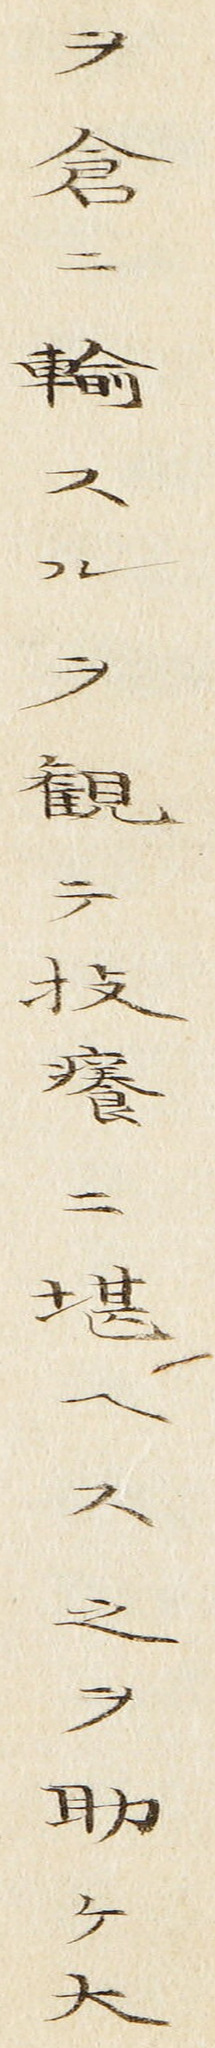ヲ倉ニ輸スルヲ観テ技癢ニ堪ヘス之ヲ助ケ大
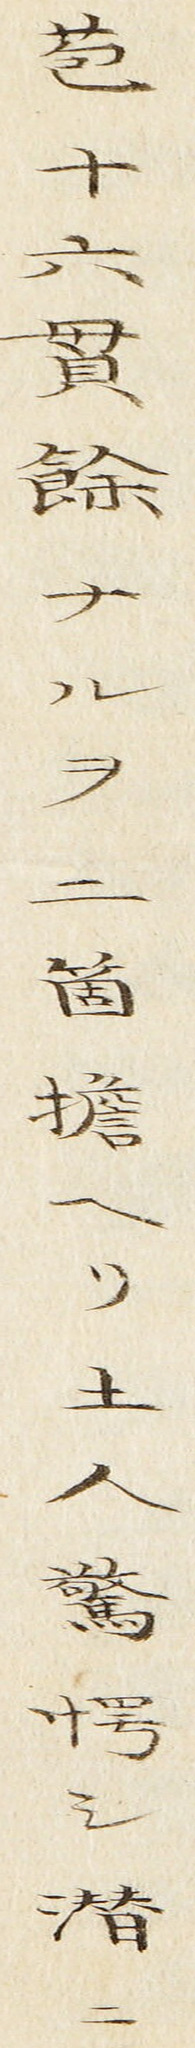苞十六貫餘ナルヲ二箇擔ヘリ土人驚愕シ潜ニ
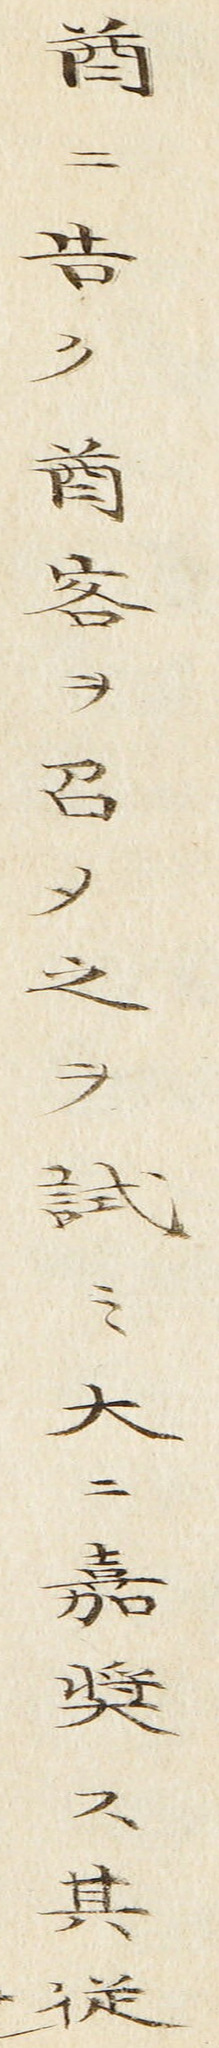酋ニ告ク酋客ヲ召シテ之ヲ試ミ大ニ嘉奨ス其従
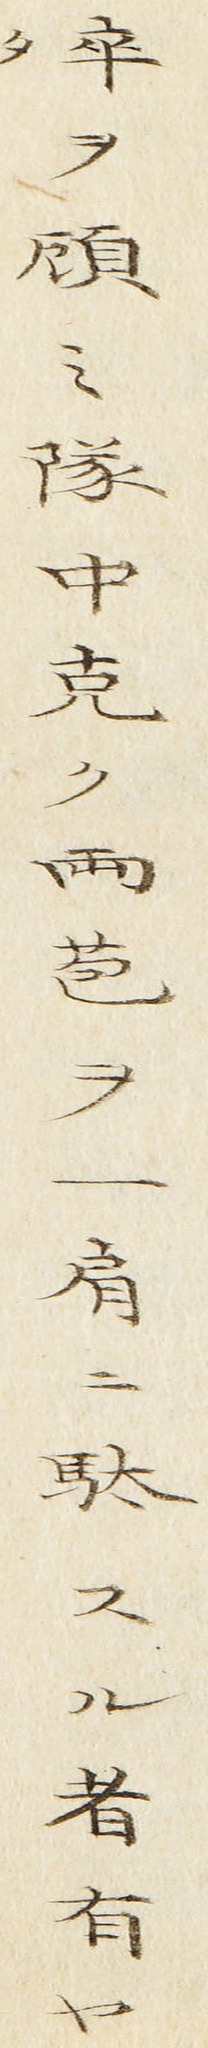卒ヲ顧ミ隊中克ク両苞ヲ一肩ニ駄スル者有ヤ
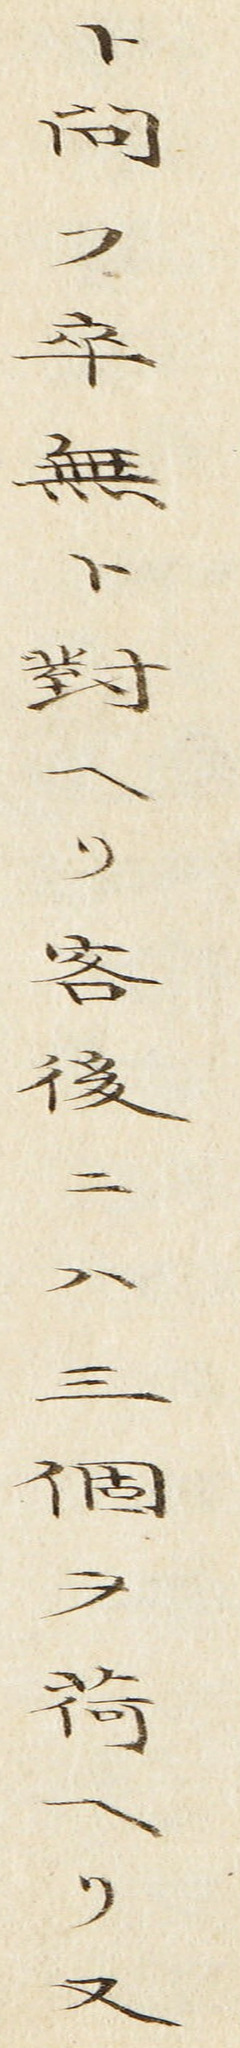ト問フ卒無ト對ヘリ客後ニハ三個ヲ荷ヘリ又
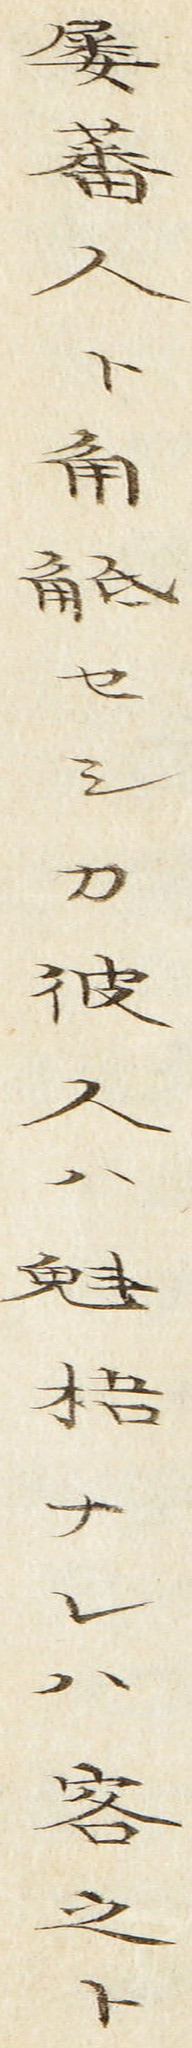屡蕃人ト角觝セシカ彼人ハ魅？梧ナレハ客之ト
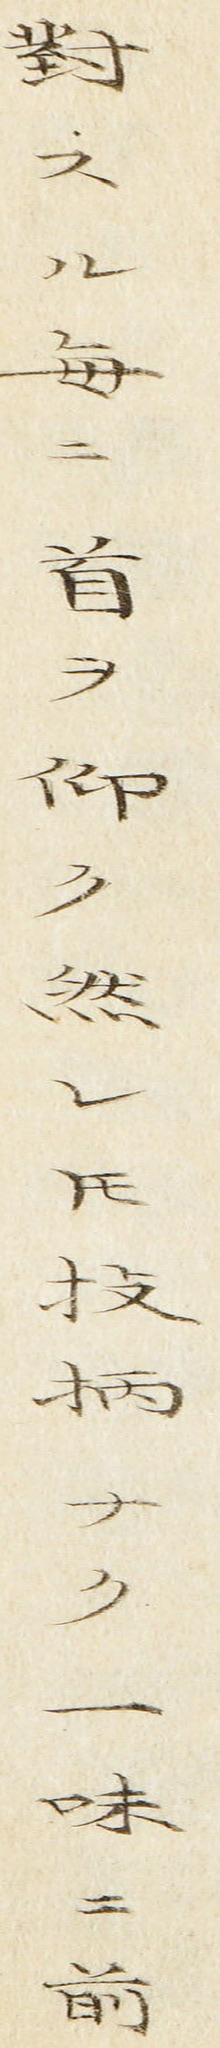對スル毎ニ首ヲ仰ク然レトモ技抦ナク一味ニ前
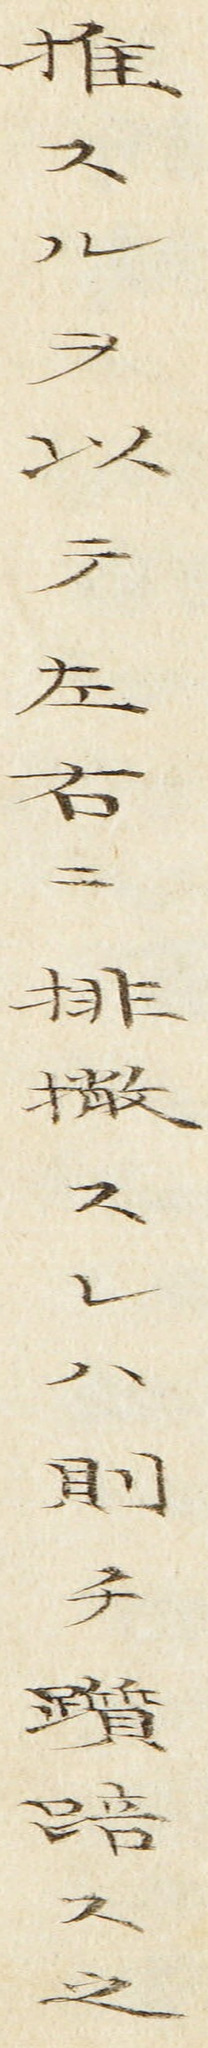推スルヲ以テ左右ニ排撒？スレハ則チ躓踣ス之
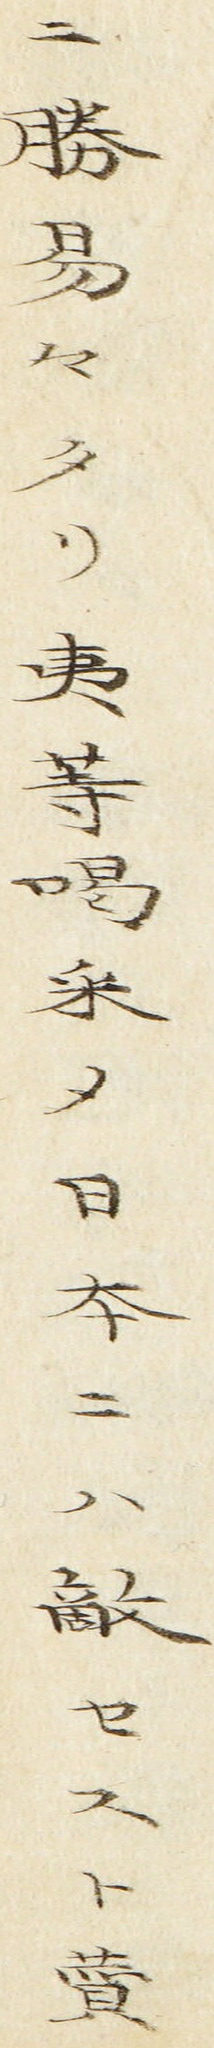ニ勝易々タリ夷等喝采シテ日本ニハ敵セスト

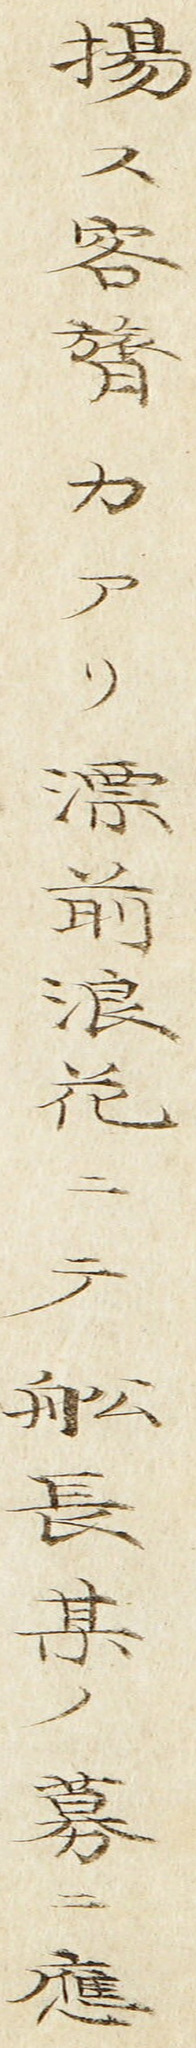揚ス客膂力アリ漂前浪花ニテ舩長某ノ募ニ應
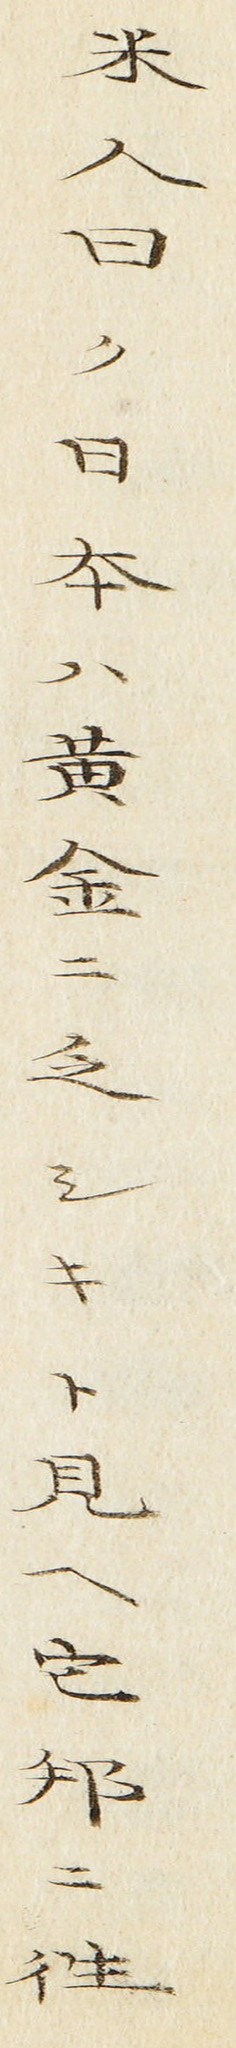〇米人曰ク日本ハ黄金ニ乏シキト見ヘ它邦ニ往
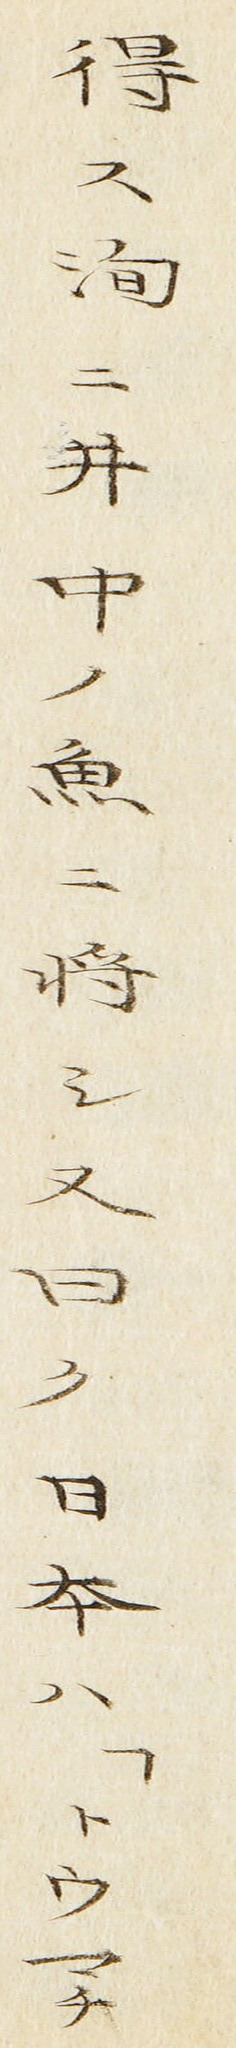得ス洵ニ井中ノ魚ニ将シ又曰ク日本ハ「トウマチ
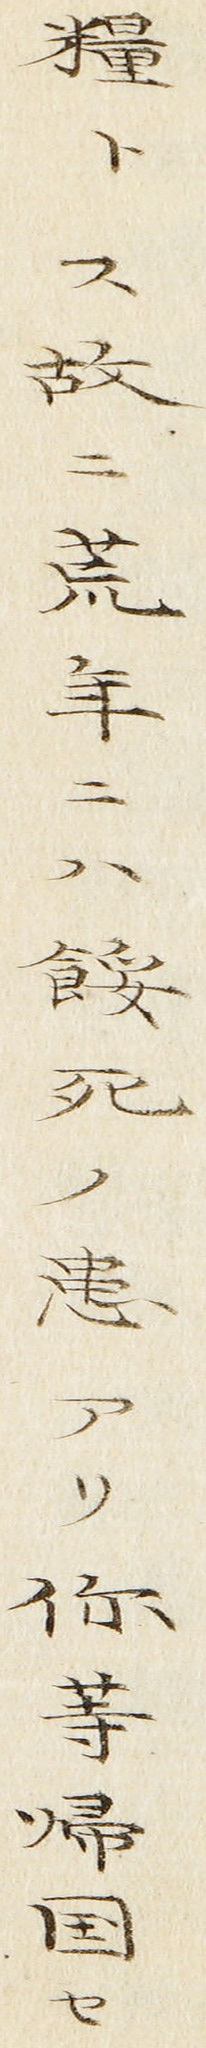糧トス故ニ荒年ニハ餒死ノ患アリ你等帰国セ
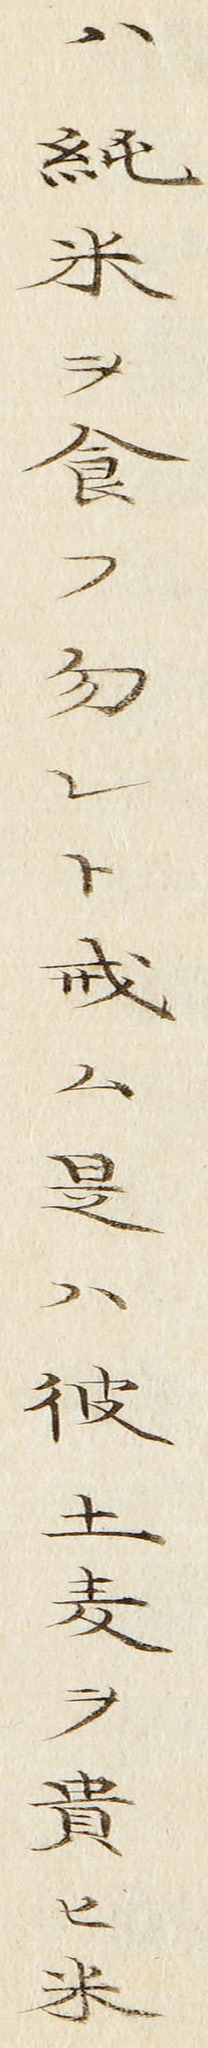ハ純米ヲ食フ勿レト戒ム是ハ彼土麦ヲ貴ヒ米
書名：蕃談
